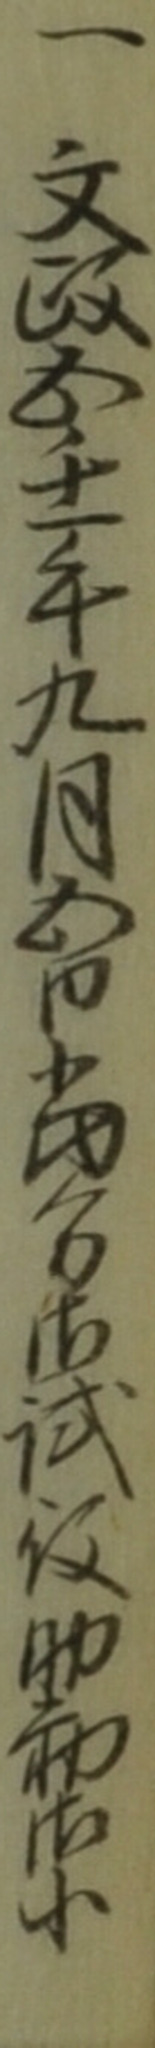一文政五壬午九月五日当分御試役助勤御小
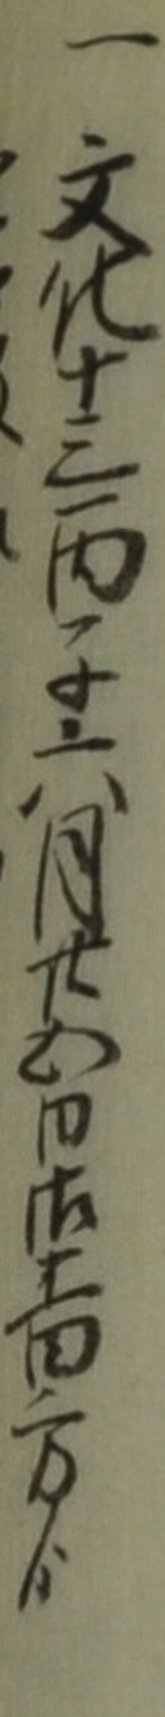一文化十三丙子正月十五日御番方ゟ
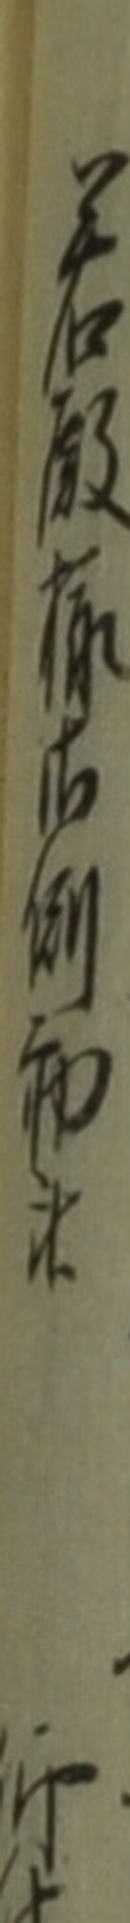若殿様御側勤被仰付之
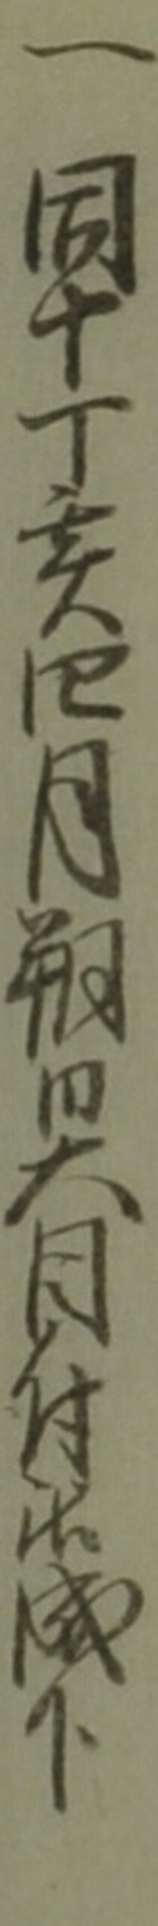一同十丁亥四月朔日大目付被成下
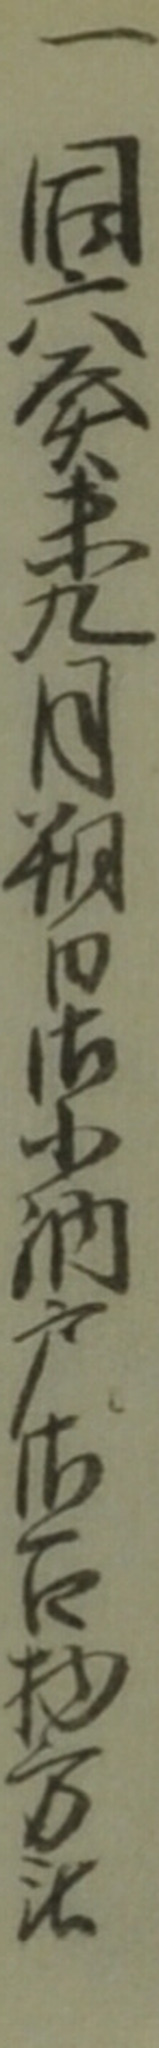一同六癸未九月朔日御小納戸御召物方被
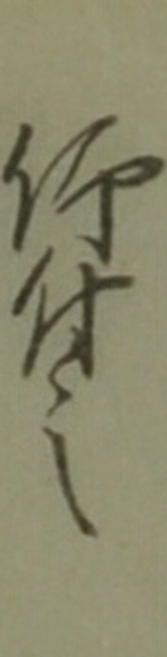仰付之
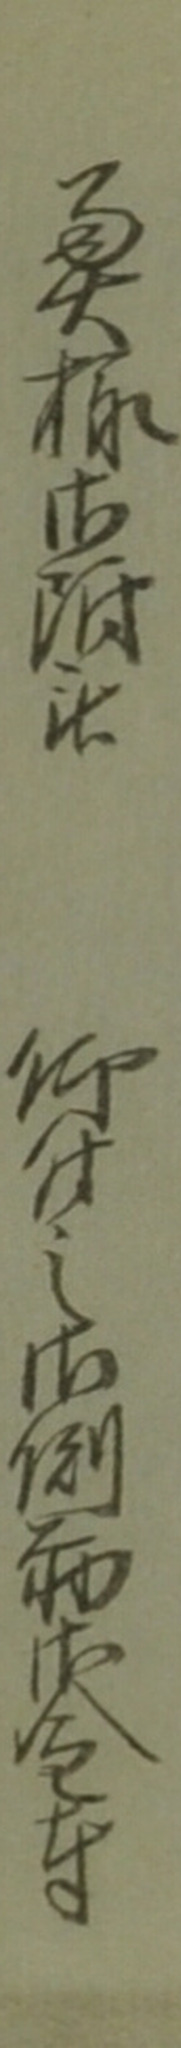奥様御附被仰付之御側勤御金奉
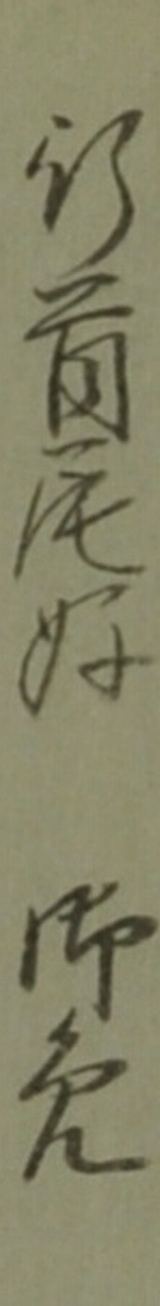行首尾好御免
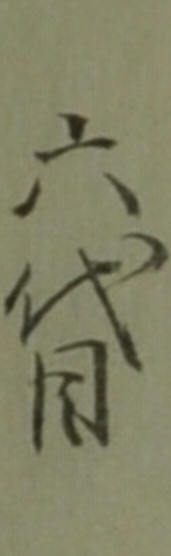六代目
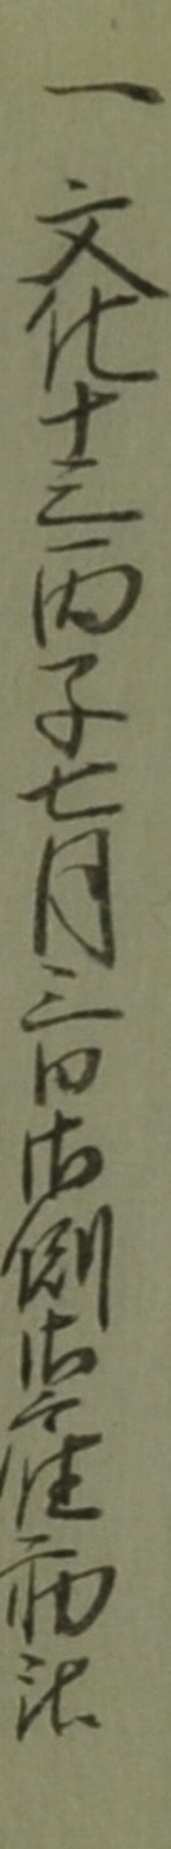一文化十三丙子七月三日御側御雇勤被
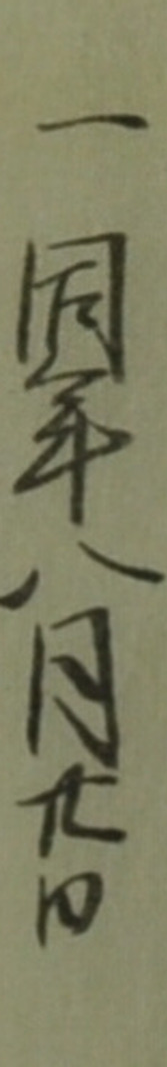一同年八月廿日
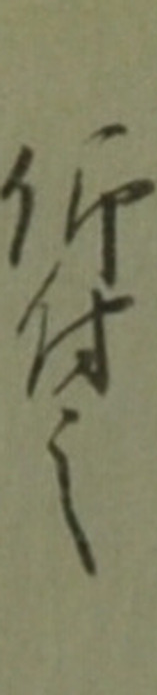仰付之
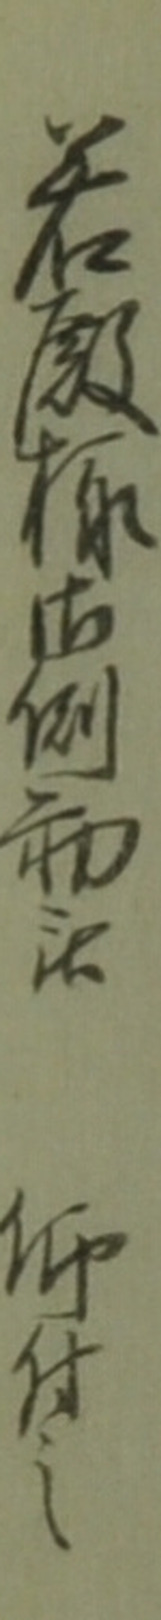若殿様御側勤被仰付之
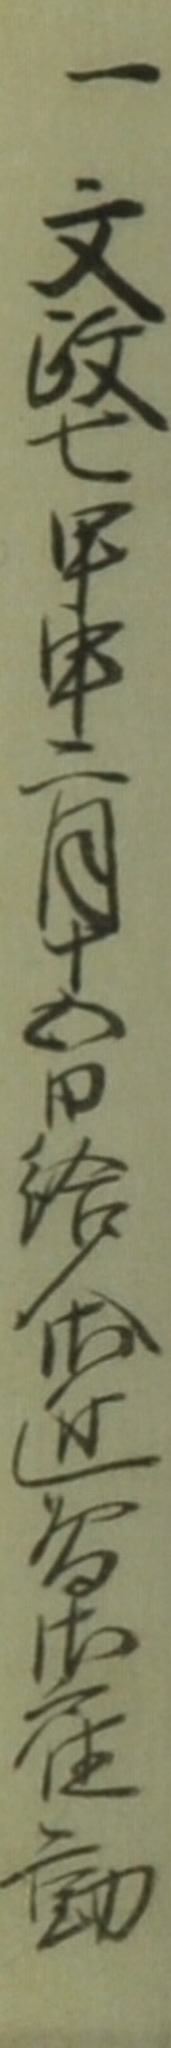一文政七甲申ｎ二月十五日給人お御近習御雇勤

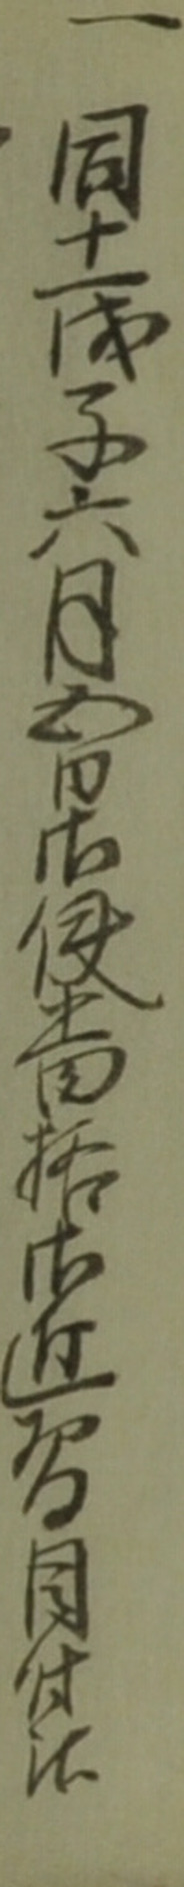一同十一戊子六月五日御使番格御近習目付被
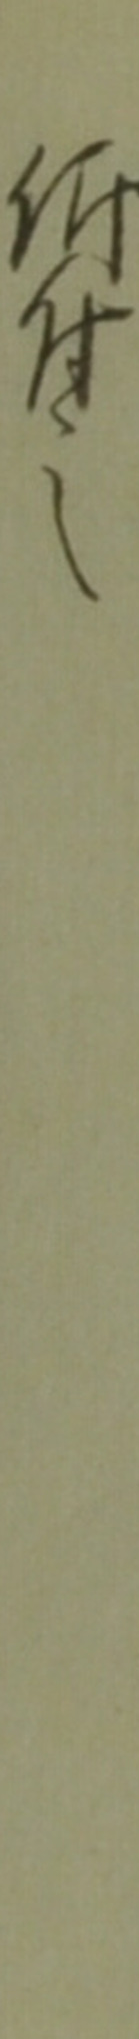仰付之
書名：諸御役代々録（五）
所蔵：伊那市立高遠町図書館・合同会社AMANE
